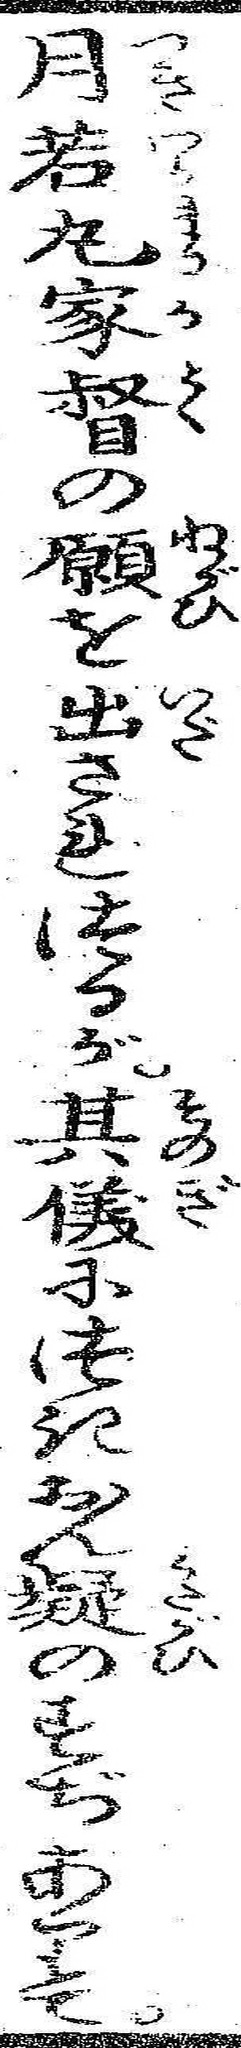月若丸家督の願を出されつるが。其儀につきおん疑のすぢありて。
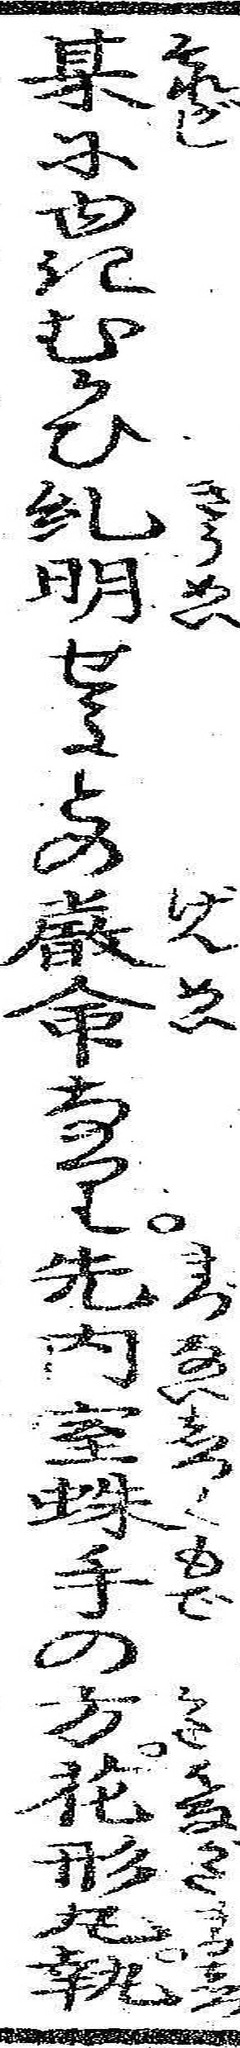某にゆきむかひ糺明せよとの厳命なり。先内室蛛手の方。花形丸。執
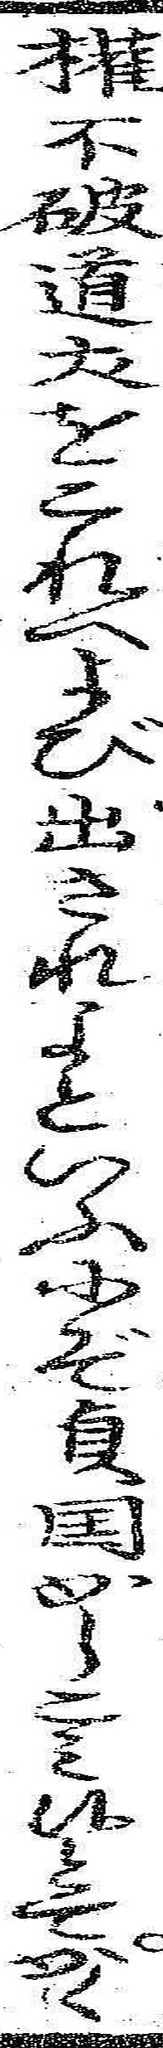権不破道犬をこれへよび出されよといふにぞ。貞国かしこみ候とて。かく
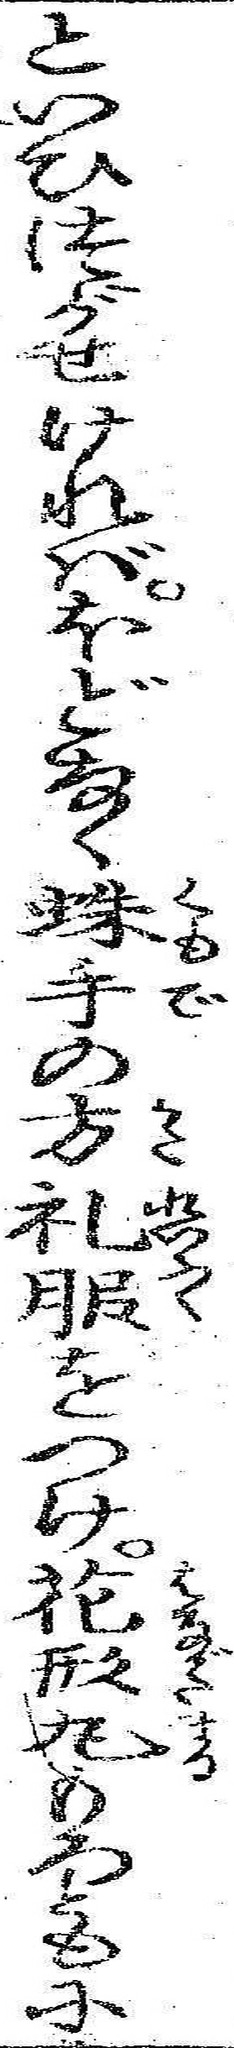といひつがせければ。ほどなく蛛手の方礼服をつけ。花形丸もろともに
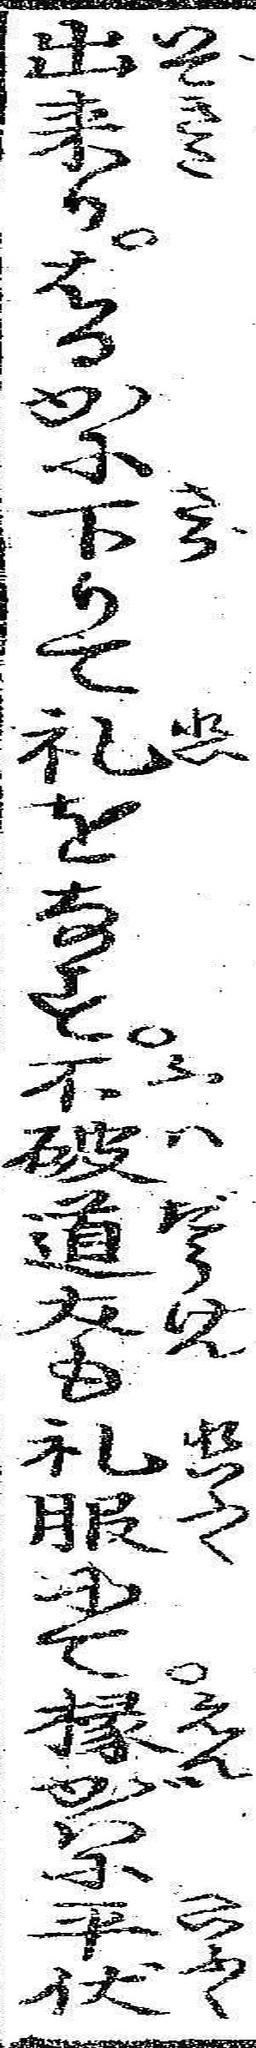出来り。はるかに下りて礼をなす。不破道犬も礼服にて。椽がはに平伏

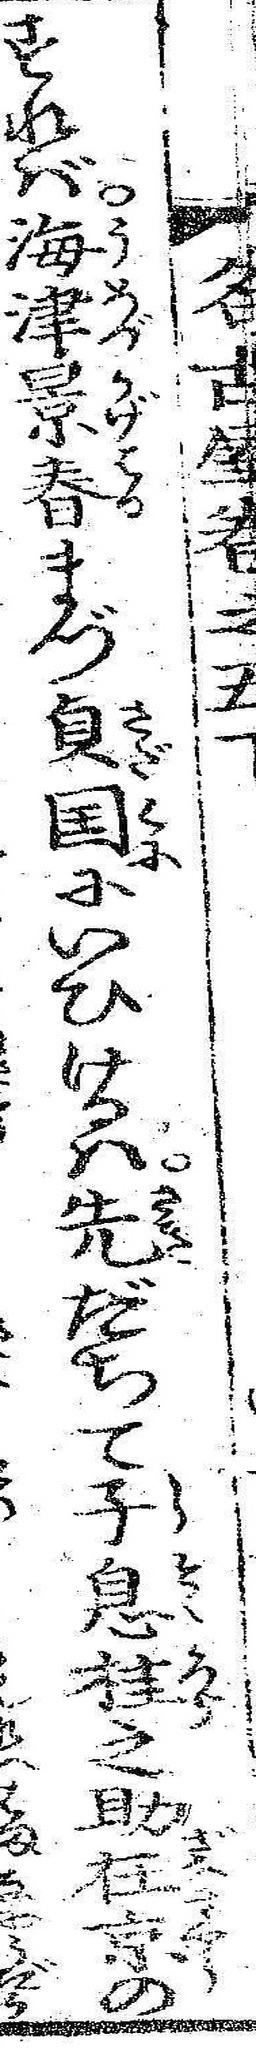すれば。海津景春まづ貞国にいひけるは。先だちて子息桂之助在京の
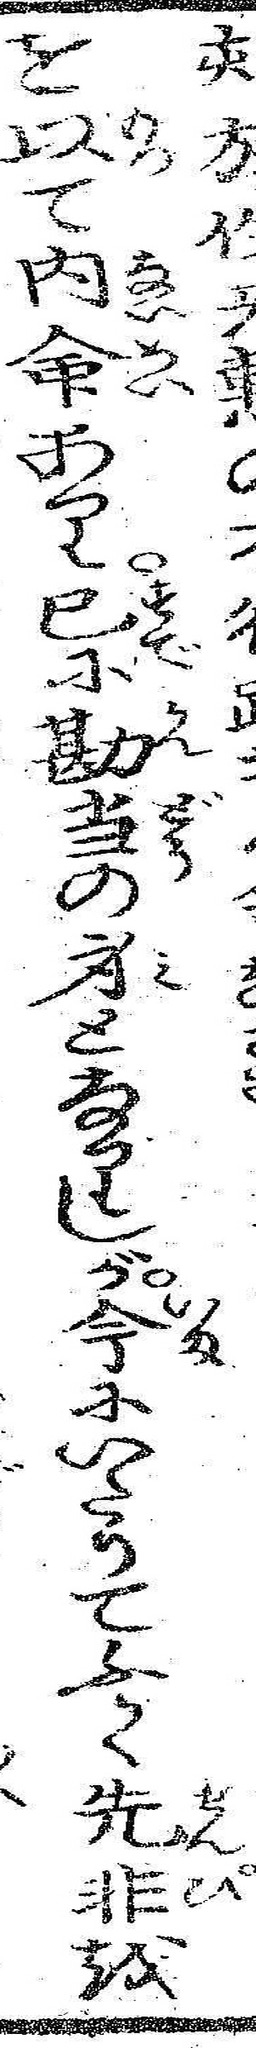を以て内命あり。已に勘当の身となりしが。今にいたりてふかく先非を
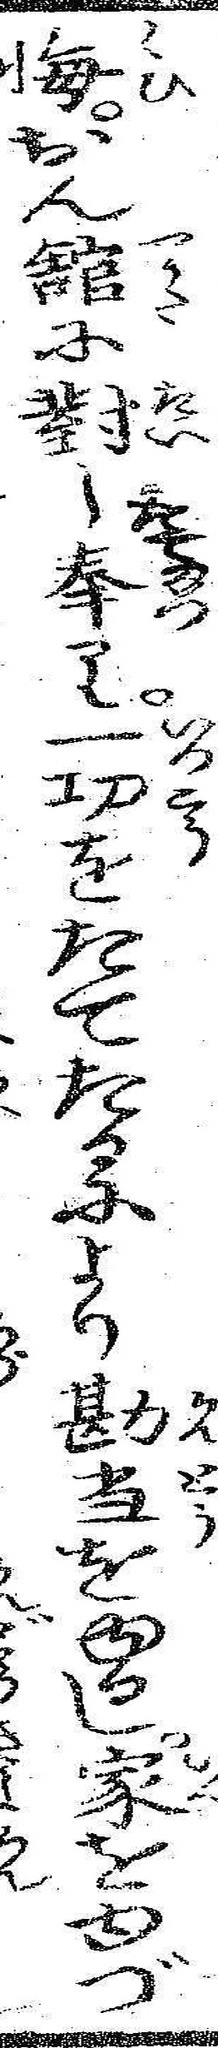悔。おん館に対し奉り。一㓛をたてたるにより勘当をゆるし。家をゆづ
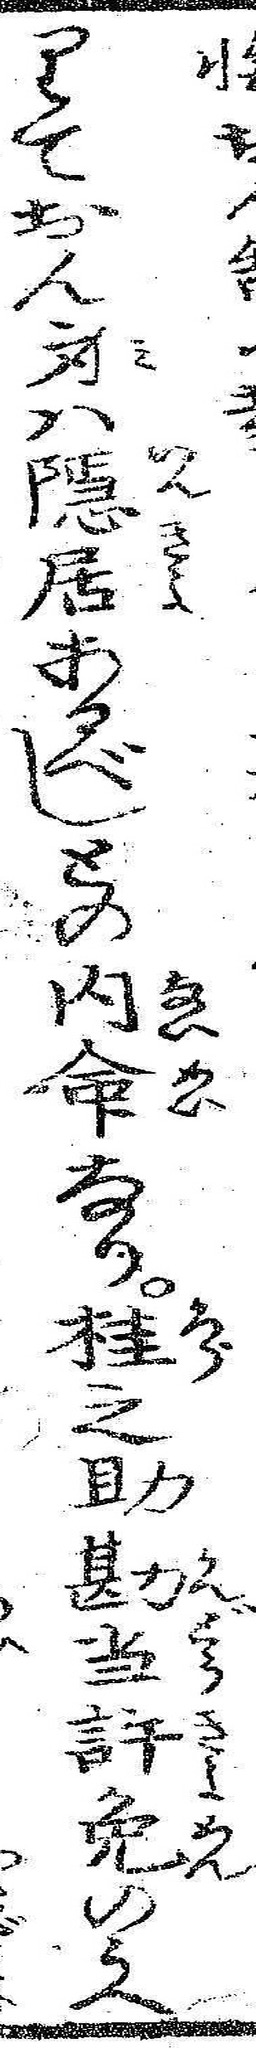りておん身は隠居あるべしとの内命なり。桂之助勘当許免のうへ
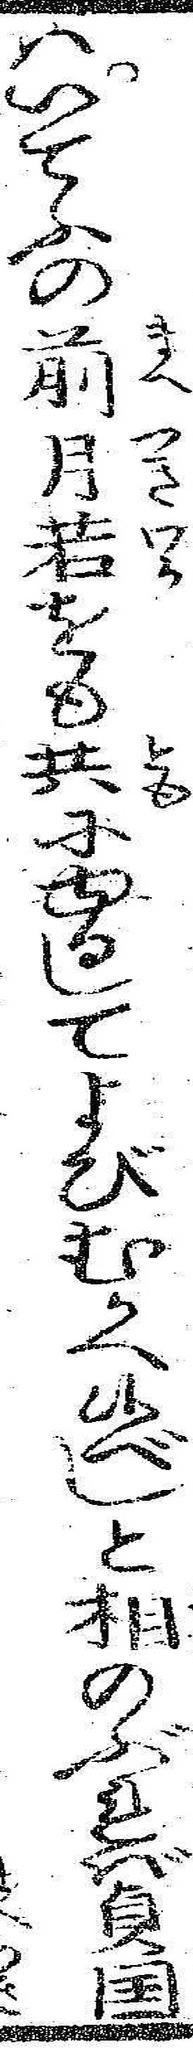は。いてふの前月若をも共にゆるしてよびむかへ候べしと相のぶれば。貞国
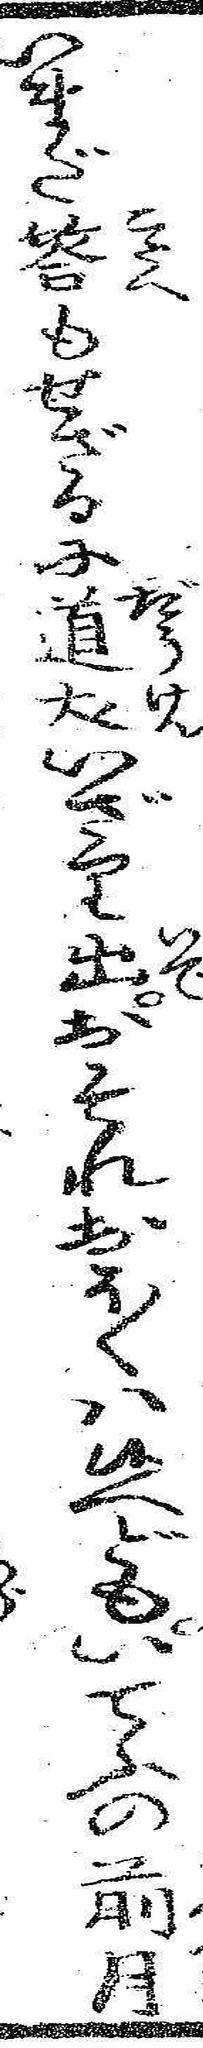いまだ答もせざるに道犬いざり出。おそれおほ〱は候へども。いてふの前月
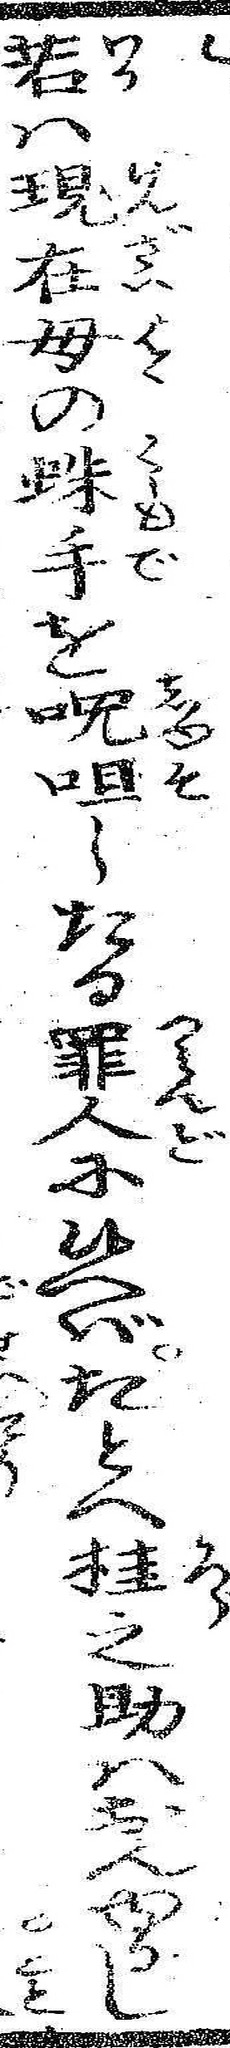若は現在母の蛛手を呪咀したる罪人に候へば。たとへ桂之助はおんゆるし
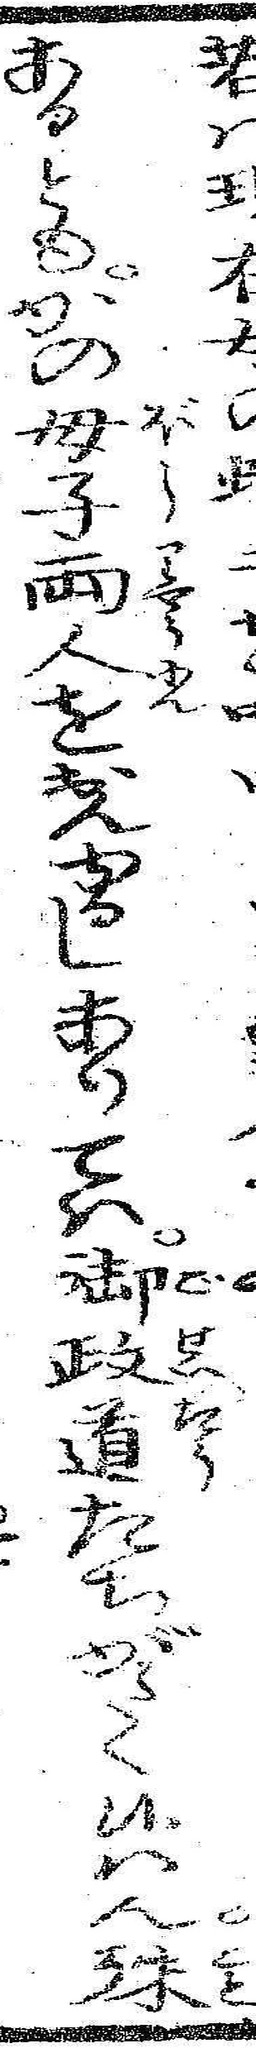あるとも。かの母子両人をおんゆるしありては。御政道たちがたく候はん。殊
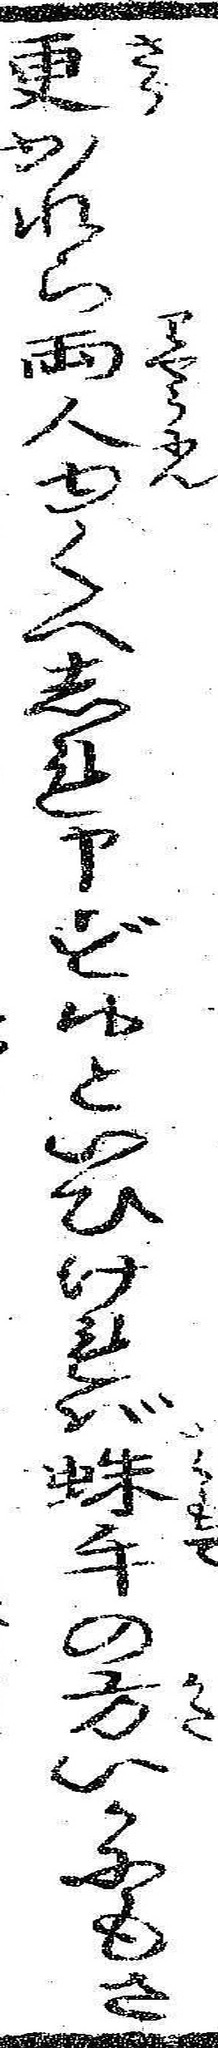更かれら両人ゆくへしれ申ず候といひければ。蛛手の方いかにもさ
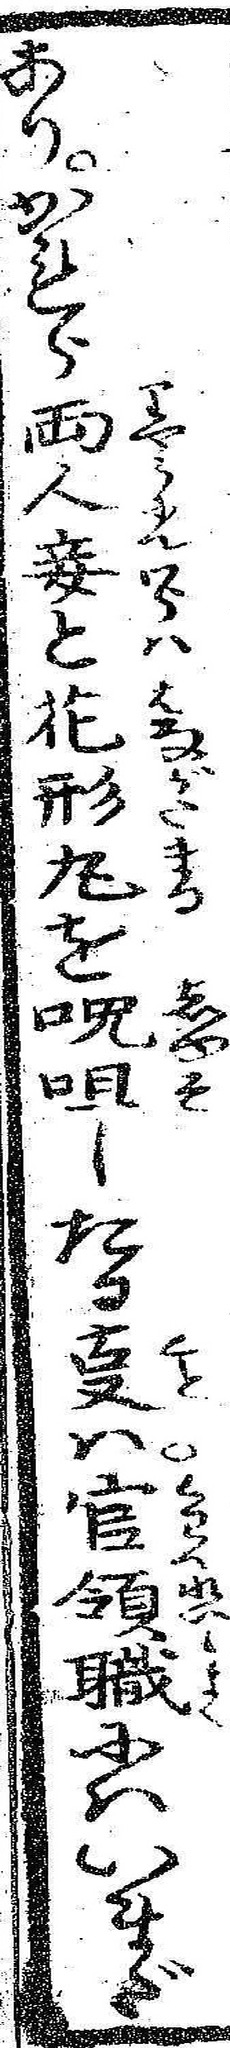あり。かれら両人妾と花形丸を呪咀したる事は。官領職にはいまだ
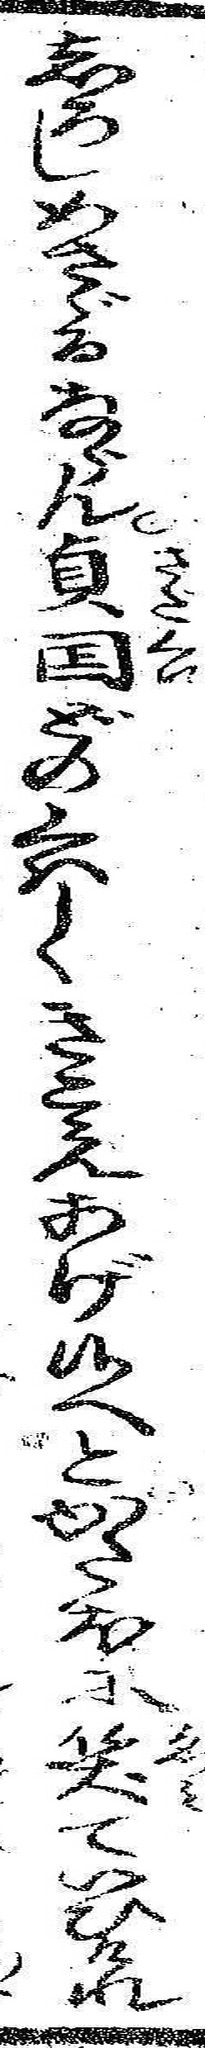しろしめさゞるならん。貞国どのくはしくきこえあげ候へと。かたほに笑ていひけれ
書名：昔話稲妻表紙
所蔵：国文学研究資料館
